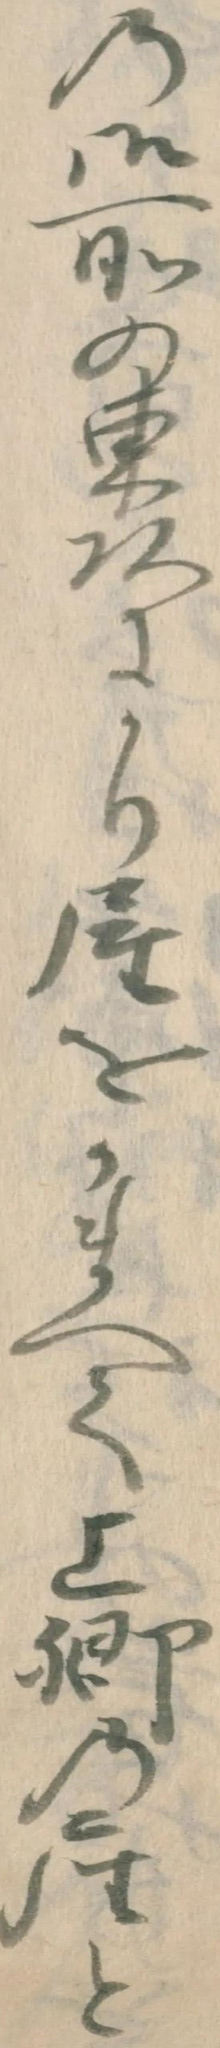の御所の東頭にかり屋をかまへて上卿の座と

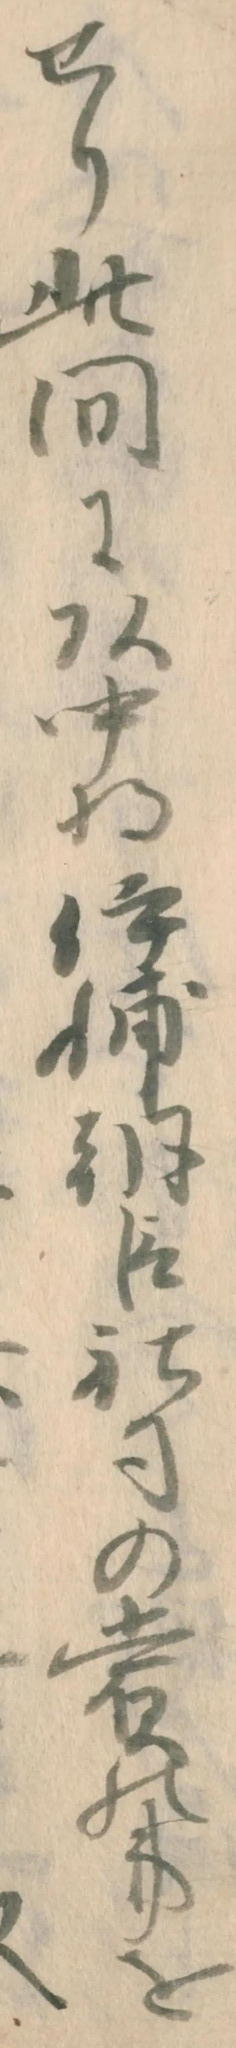せり此間に頭中将伊輔朝臣社司の賞の事を
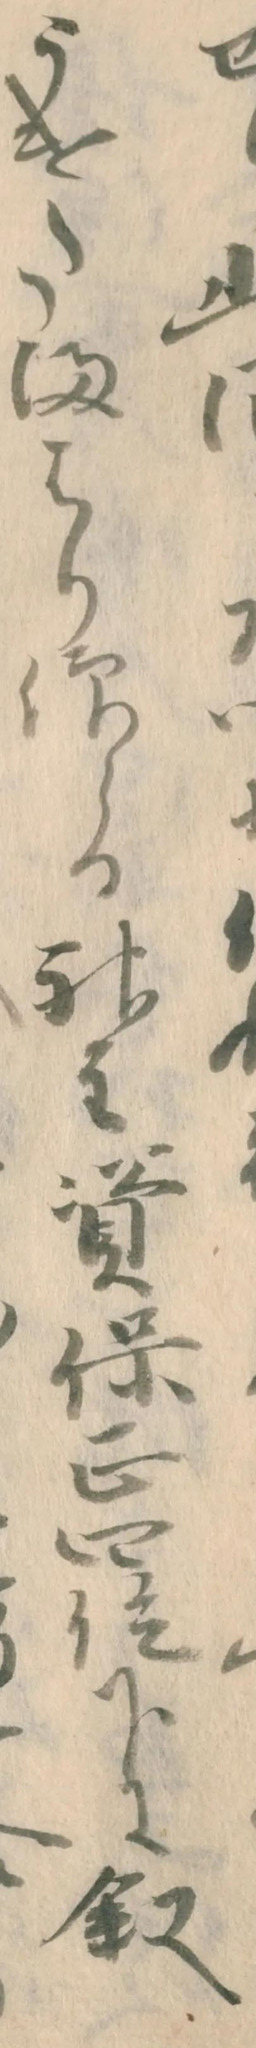うけたまはり仰らる神主資保正四位下に叙
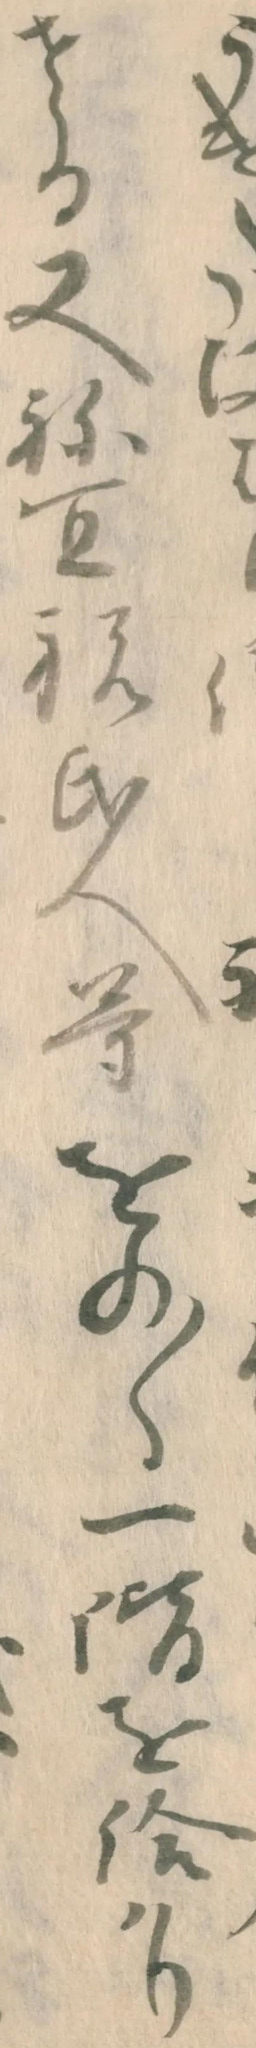せらる又弥宜祝氏人等をの〳〵一階を給はり
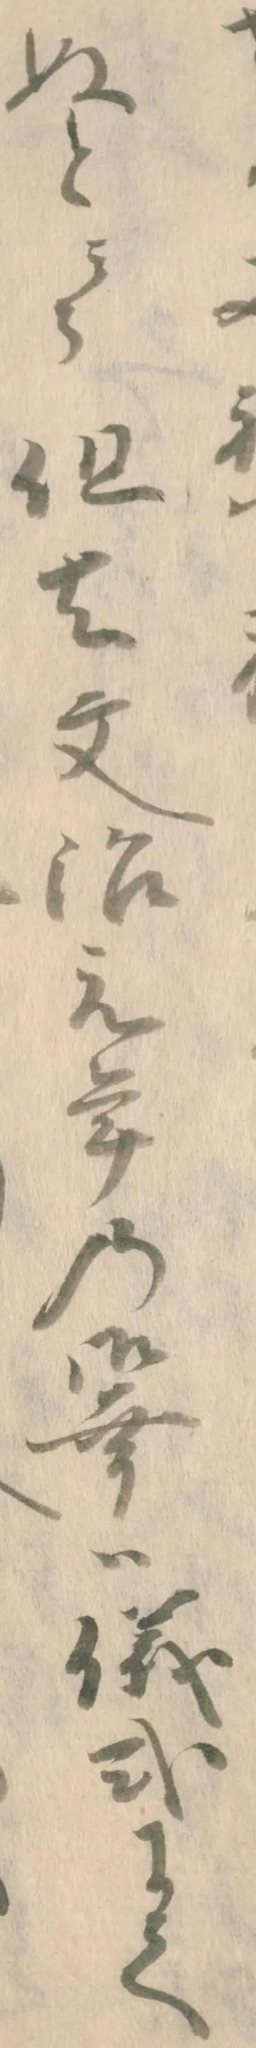ぬと云々但去文治元年の御幸は儀式にて
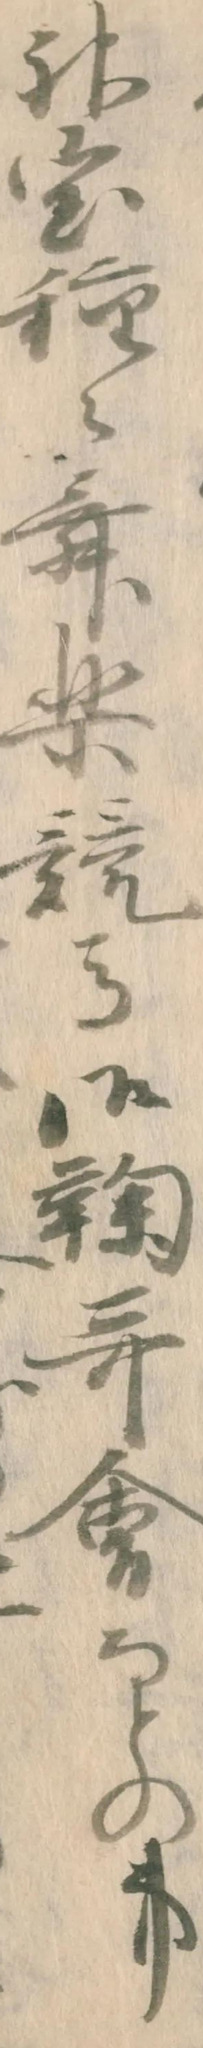神宝種々舞楽競馬御鞠哥会なとの事
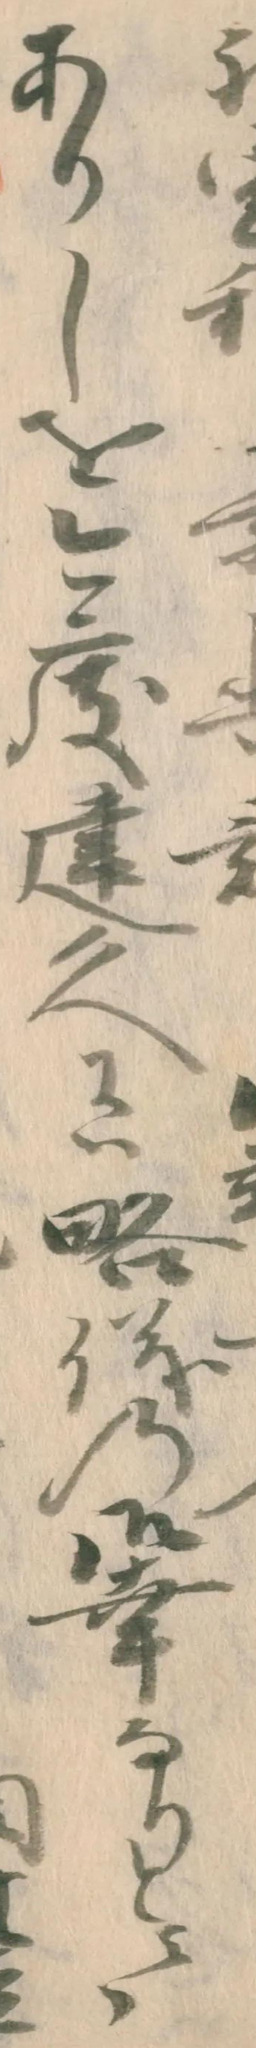ありしを今度建久には略儀の御幸なりと云々
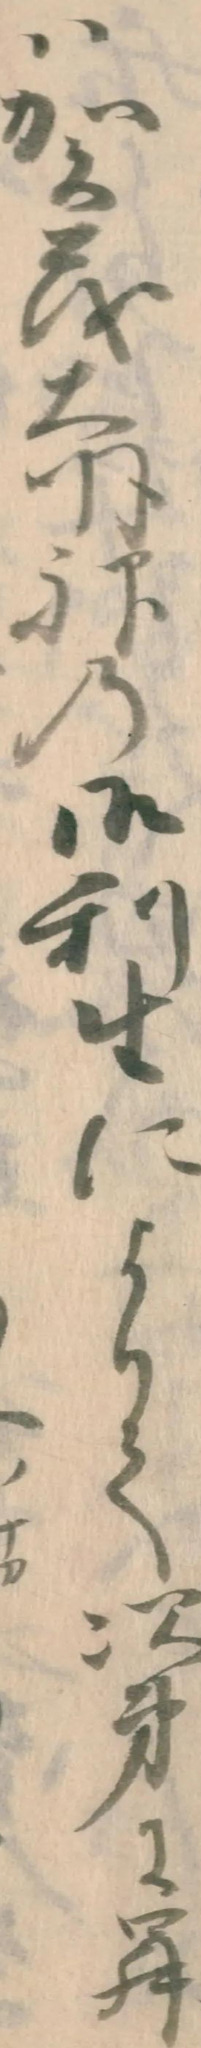は賀茂大明神の御利生によりて次第に昇
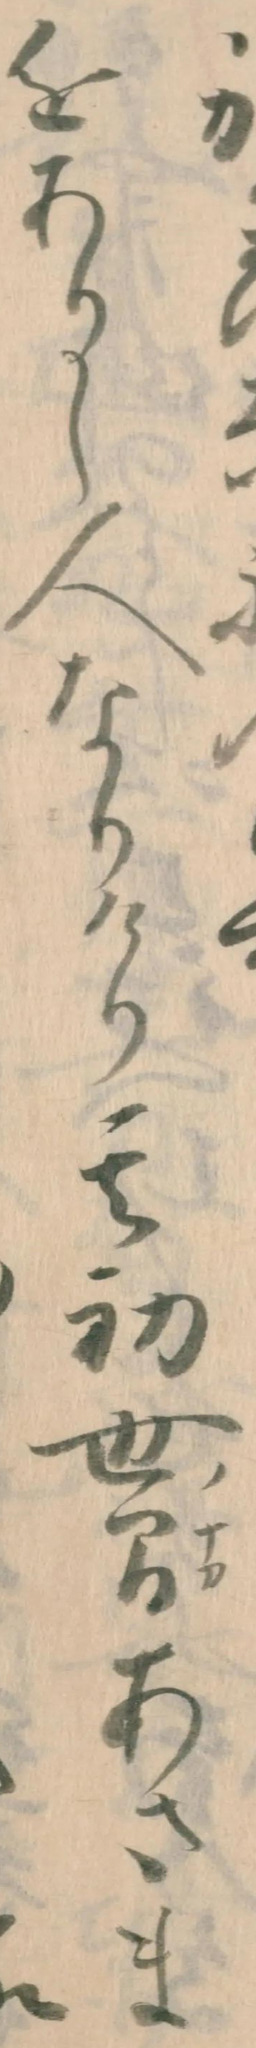進ありし人なりけり其初世間あさま
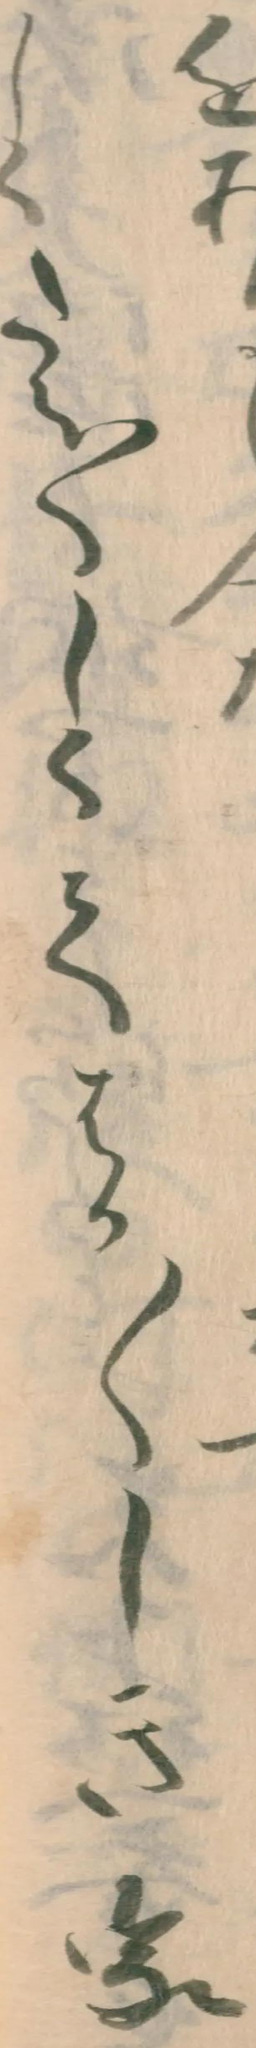しくたを〳〵しくてはか〳〵しき家
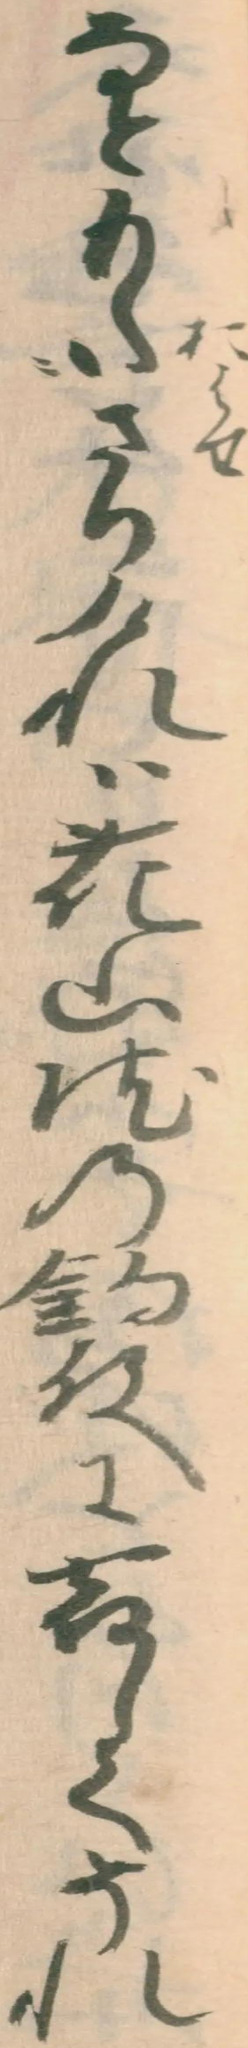なともた゛さりけれは花山院の釣殿に宿してそれ
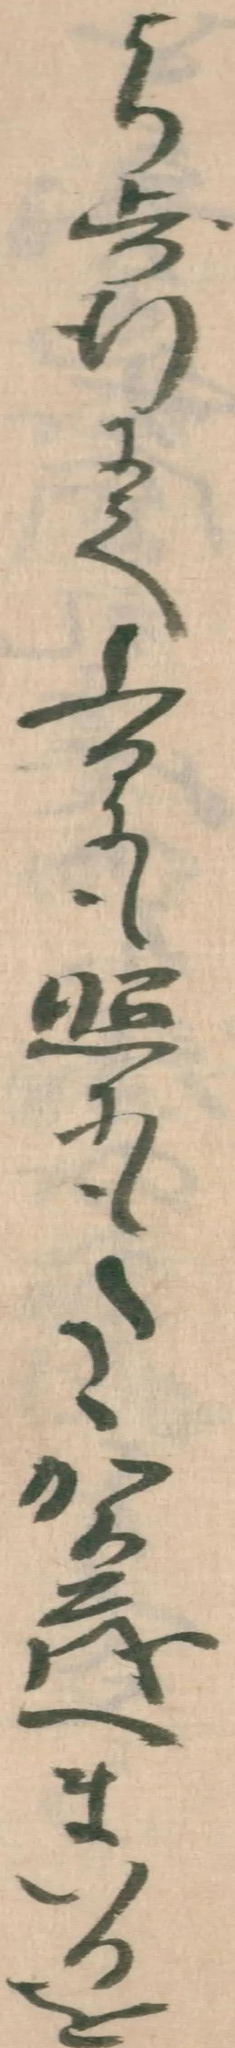より歩行にてふるにも照にもたゝ賀茂へまいるを
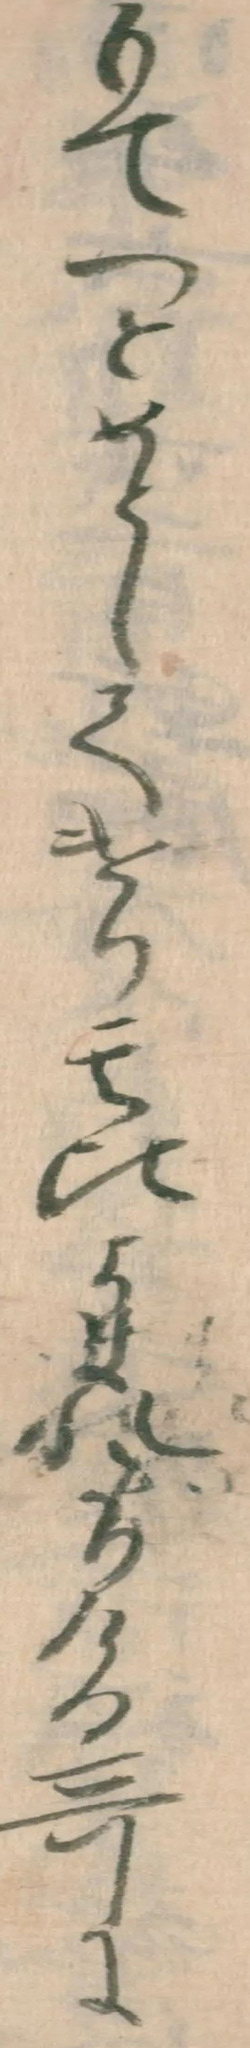もてつとめとしてけり其比よまれたりける哥に
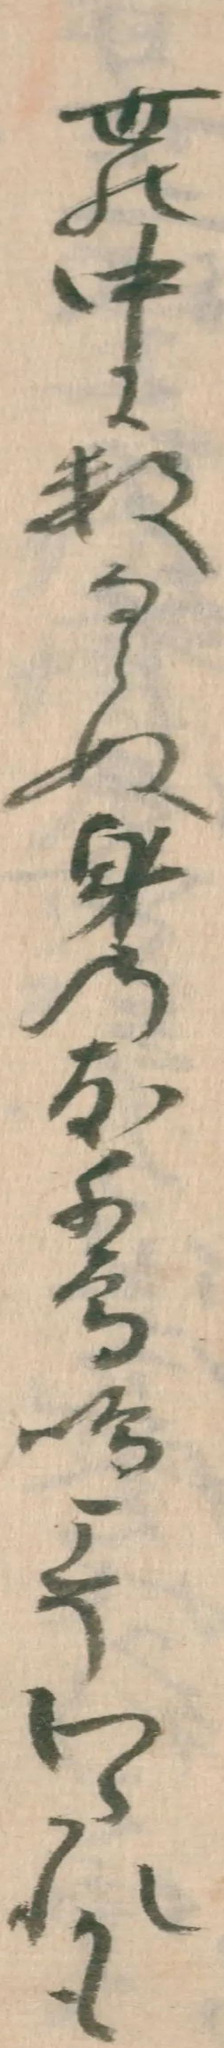世の中に数ならぬ身の友千鳥鳴こそわたれかも
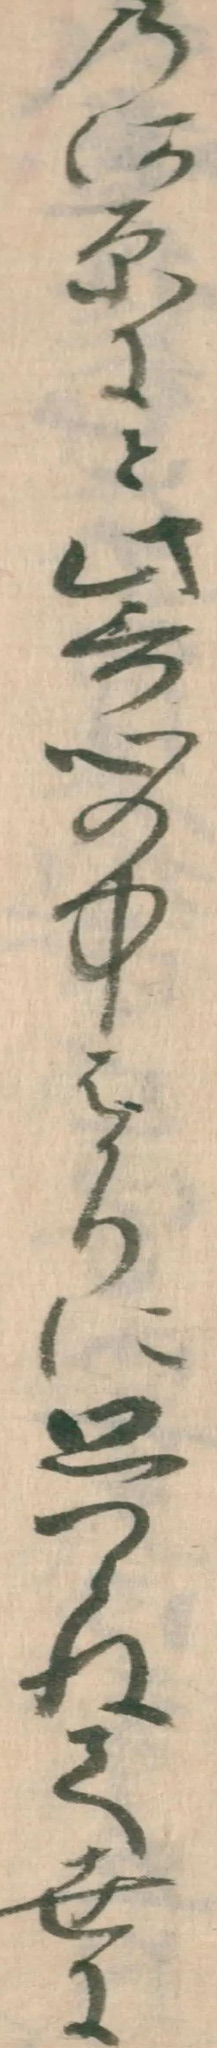の河原にと此哥心の中はかりに思つらねて世に
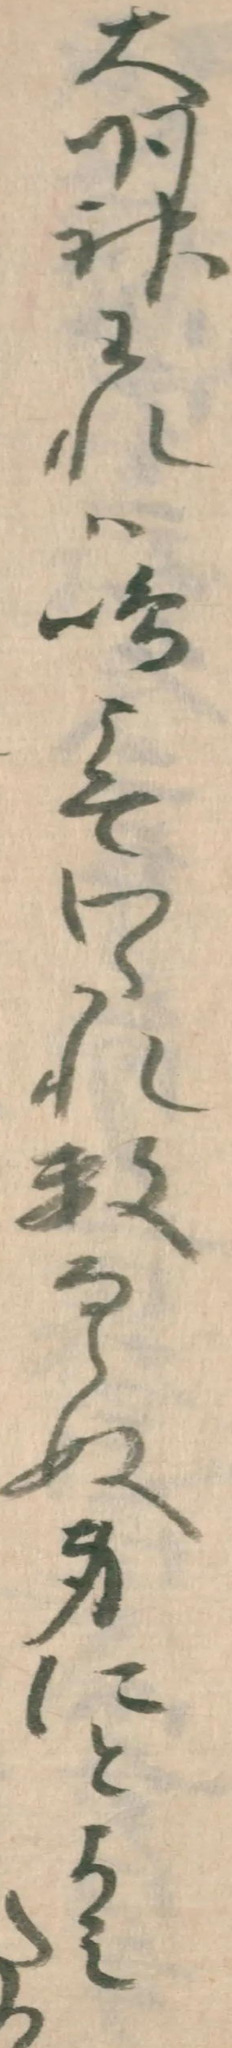大明神われは鳴こそわたれ数ならぬ身にとよみたる
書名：賀茂社記録. 第1冊
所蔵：国立国会図書館 National Diet Library, JAPAN
